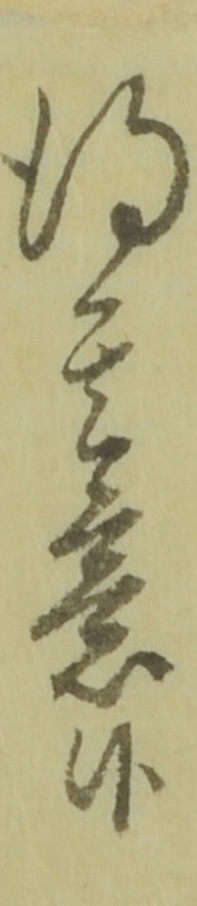得其意候
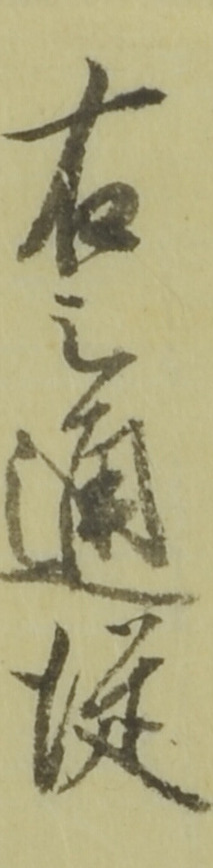右之通従
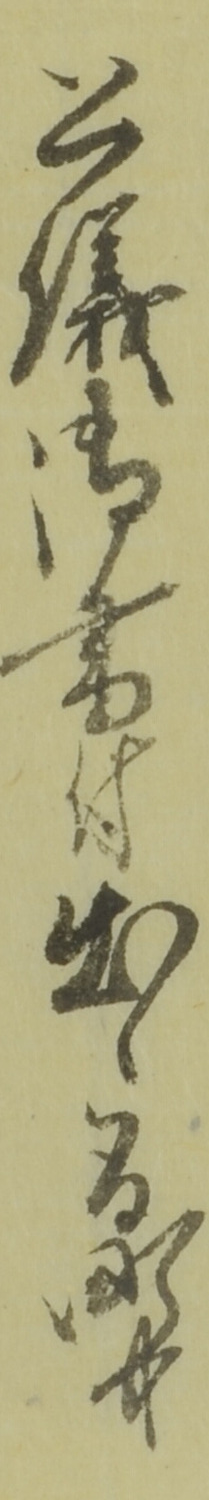公儀御書付出候旨町中
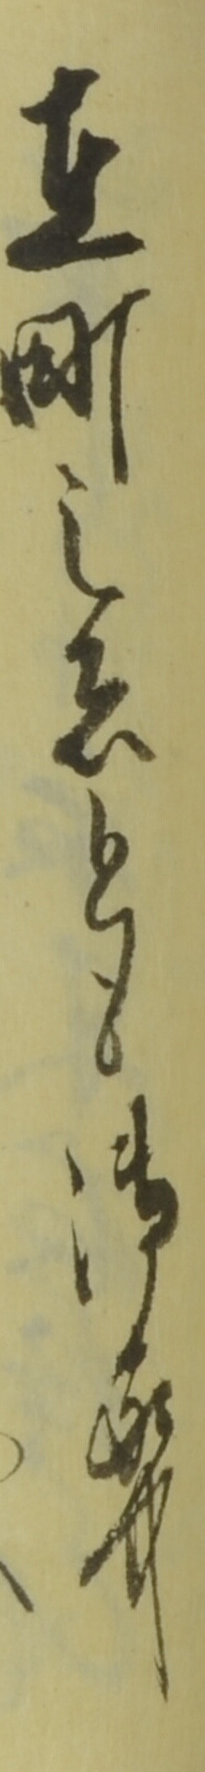在町之者とも御家中
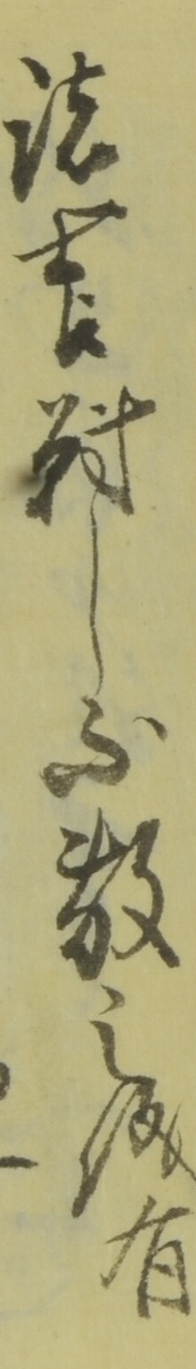諸士江対し不敬之儀有
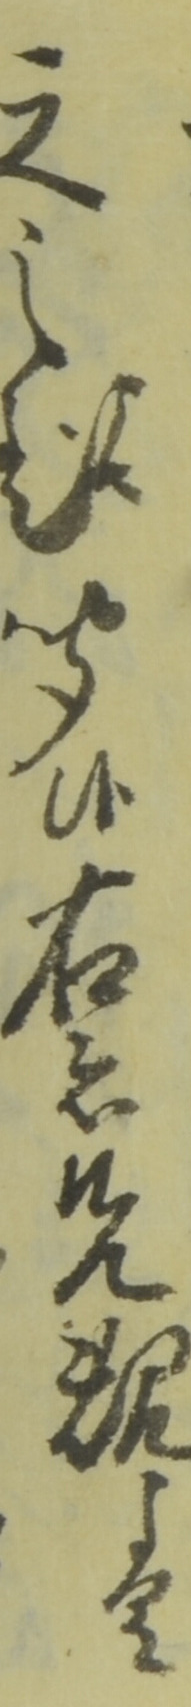之之趣聞候右は先規より

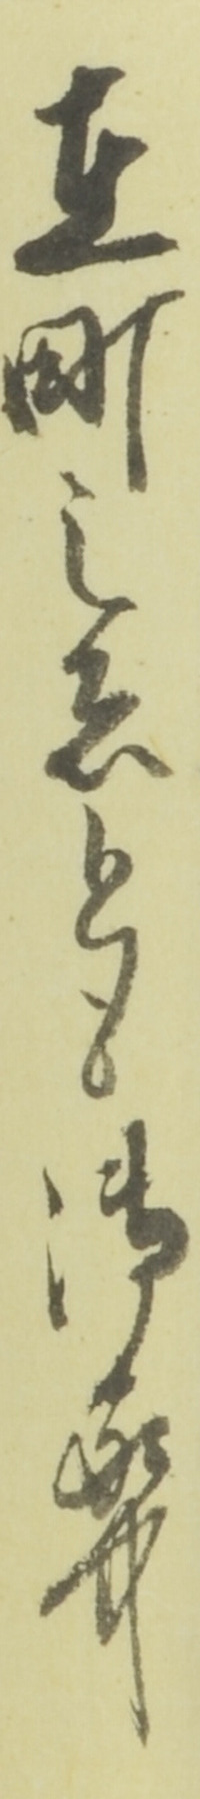在町之者とも御家中
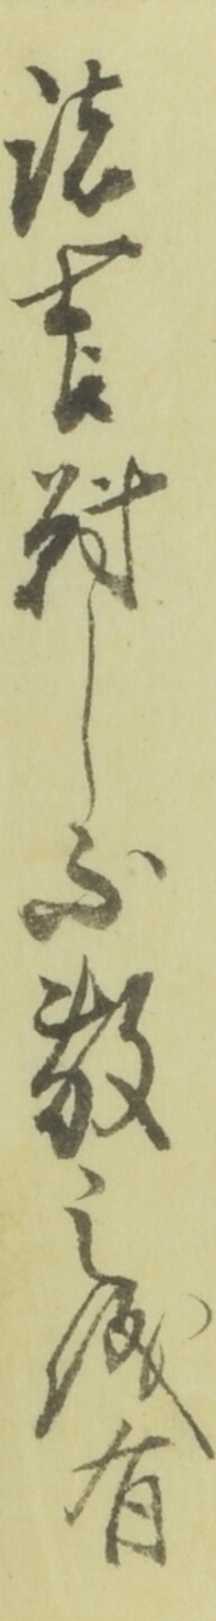諸士江対し不敬之儀有
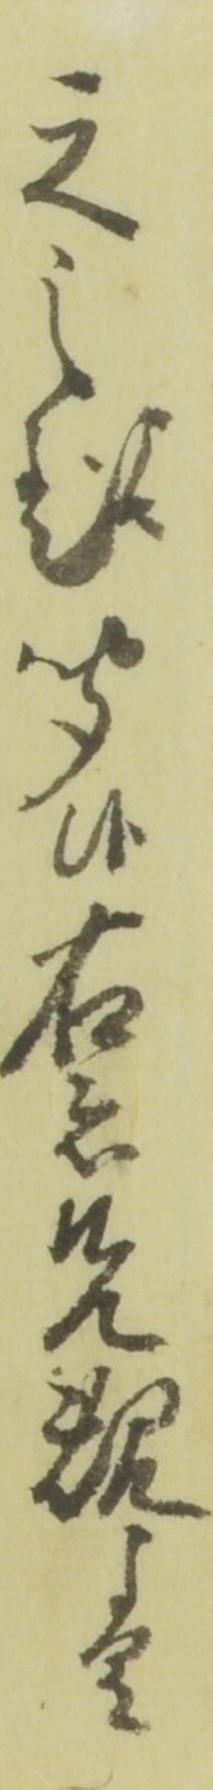之之趣聞候右は先規より
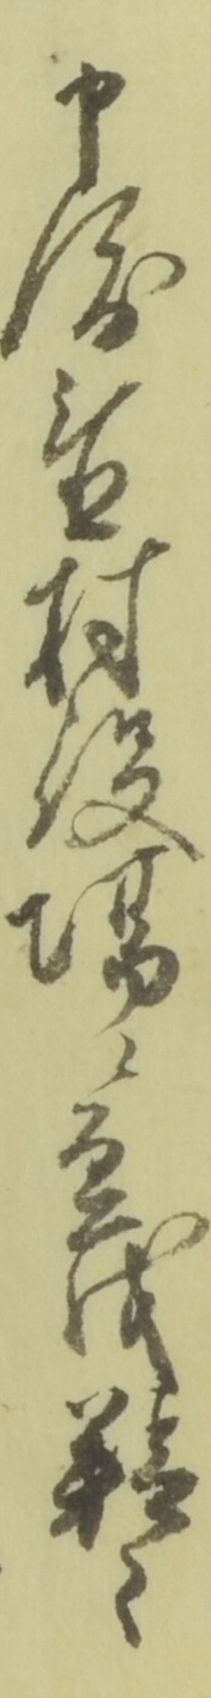申渡置村役場ニ而も精々
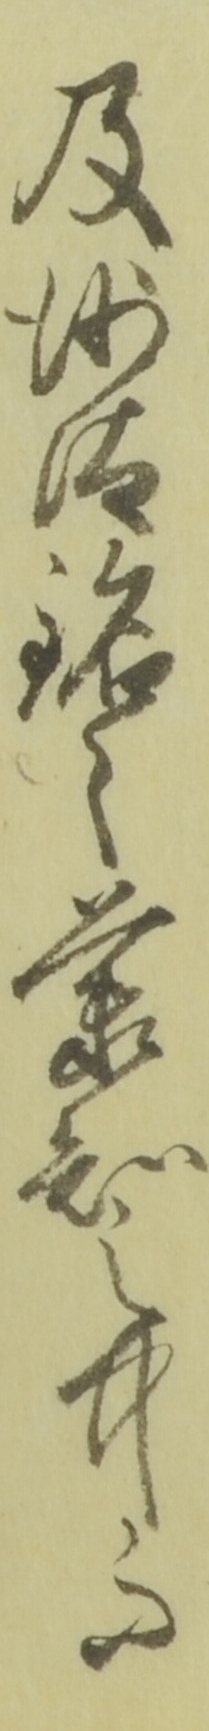及沙汰銘々承知之中不
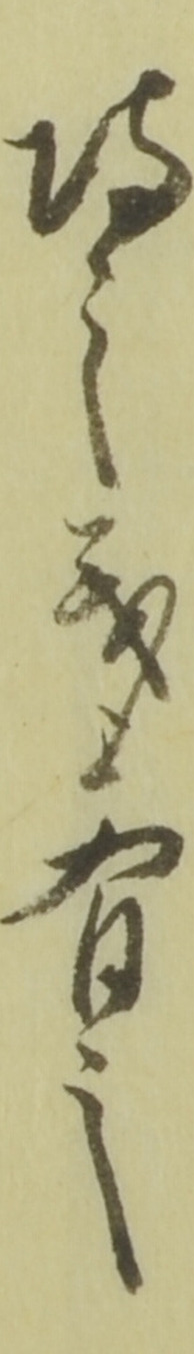埒之義も有之
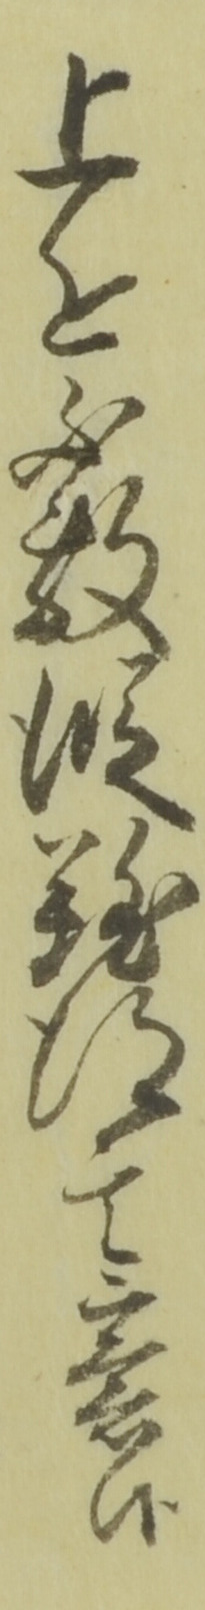上を不敬段難得其意候
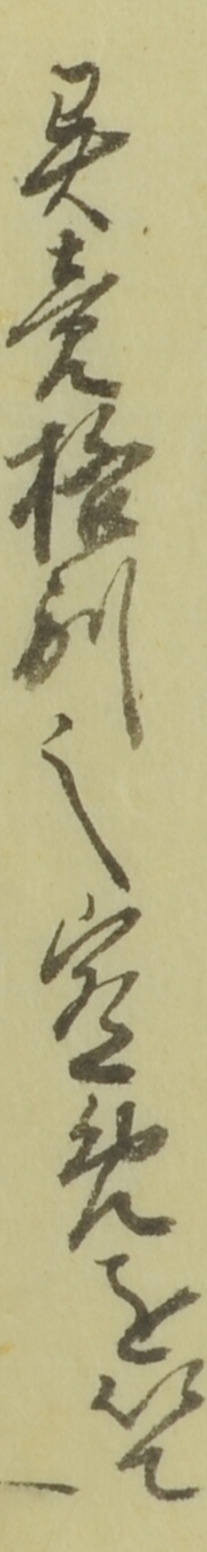畢竟格別之宥免を以て
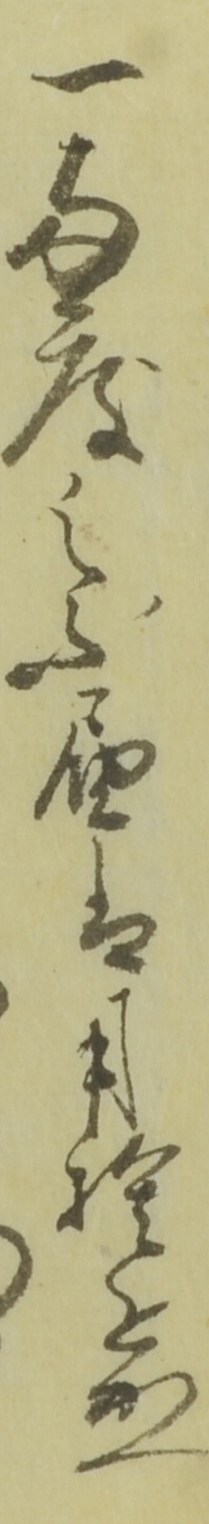一両度之不届は用捨を加へ
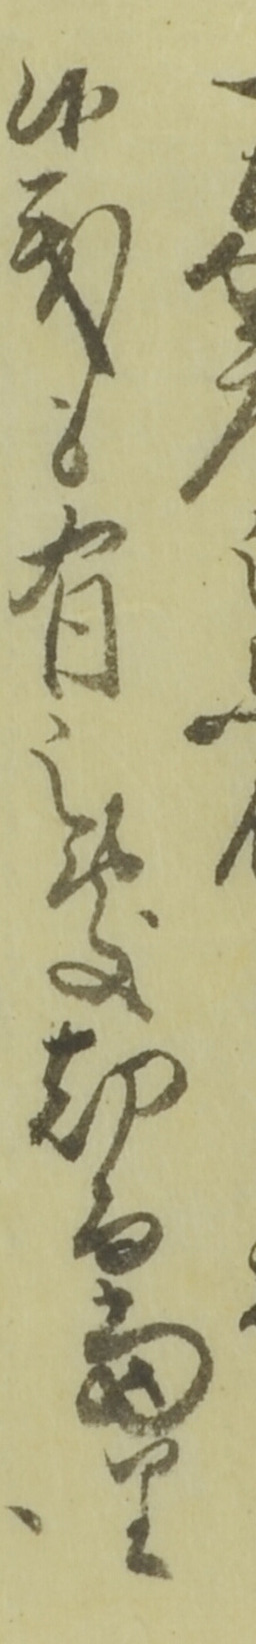候義も有之処却而当り
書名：御触書御書附控
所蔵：伊那市立高遠町図書館・合同会社AMANE
